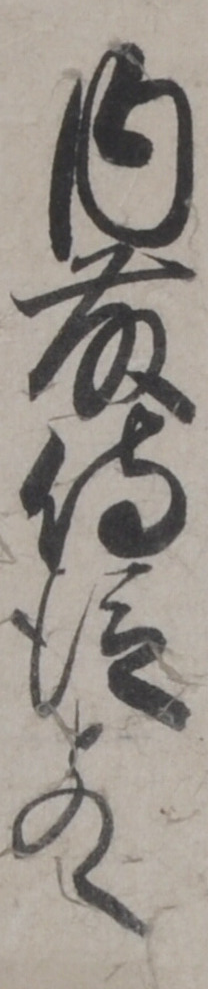内藤侍従とのへ

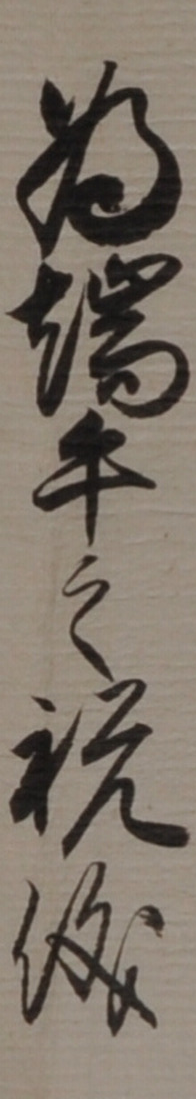為端午之祝儀
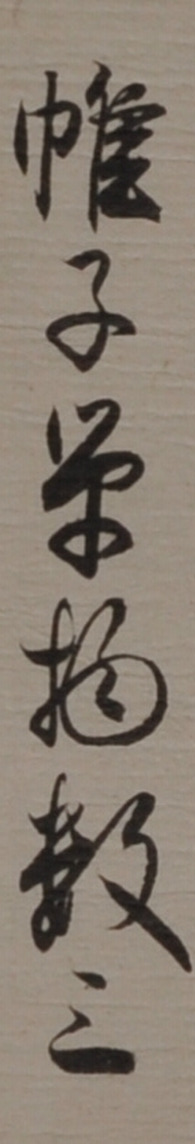帷子単物数三
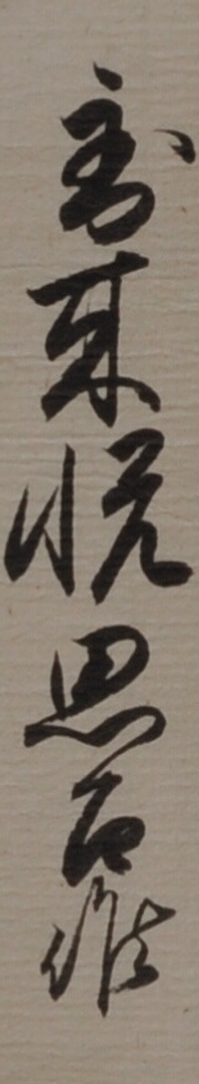到来悦思召候
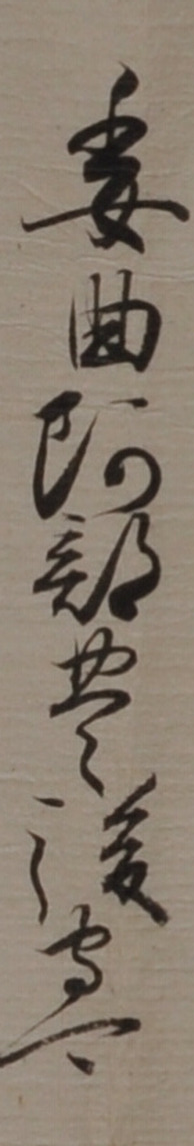委曲阿部豊後守可
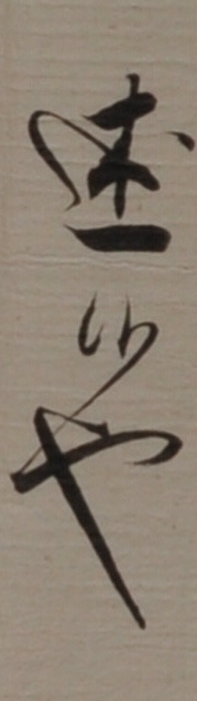述候也
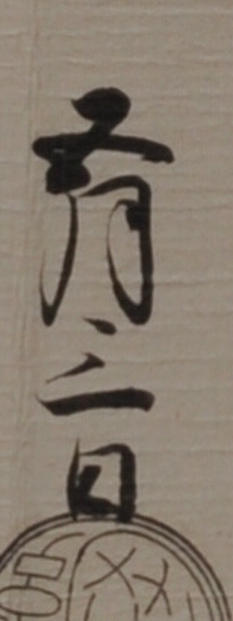五月三日
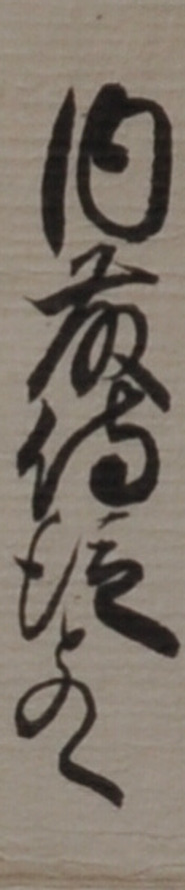内藤侍従とのへ
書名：御内書
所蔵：伊那市立高遠町図書館・合同会社AMANE
